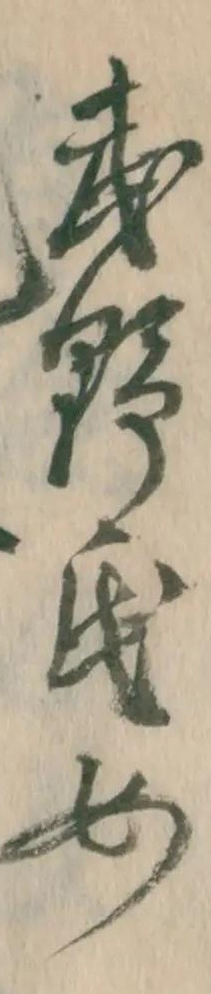武野氏女

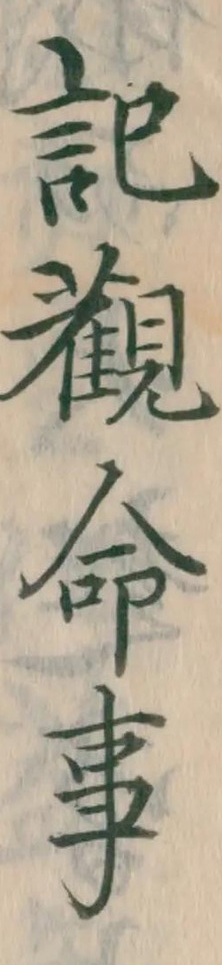記観命事
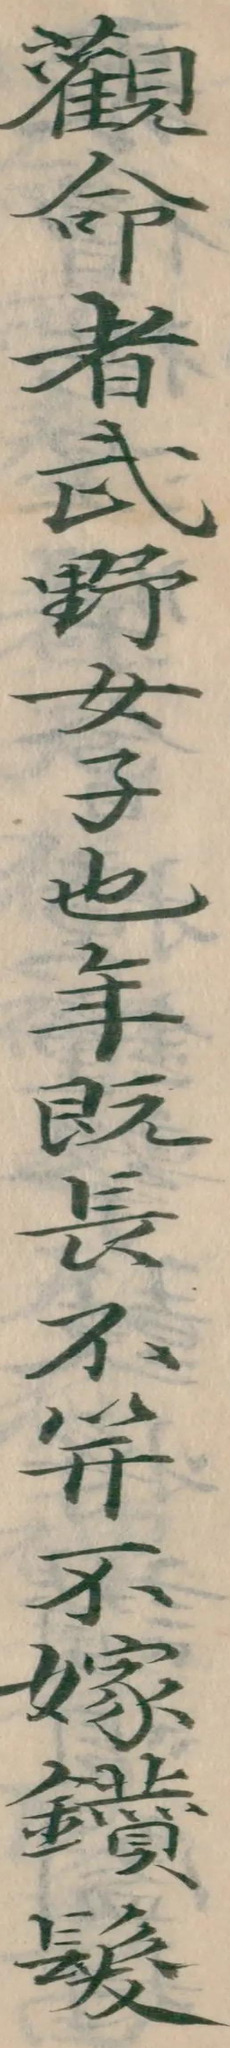観命者武野女子也年既長不笄不嫁髪
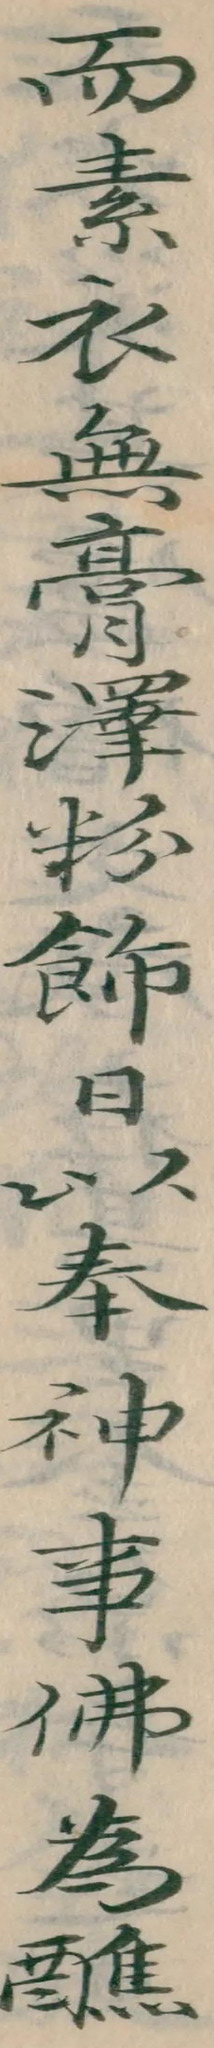而素衣無膏沢粉飾日以奉神事仏為醮
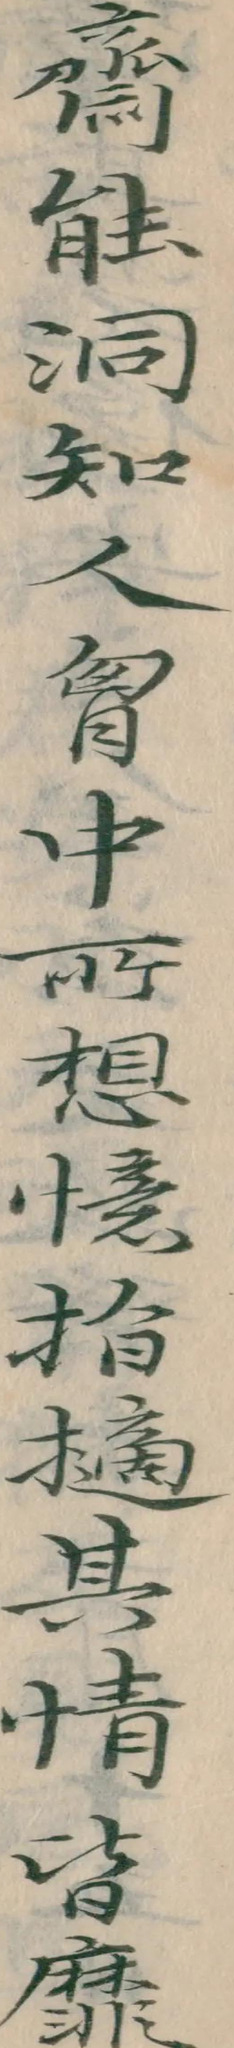斎能洞知人中所想憶指擿其情皆靡
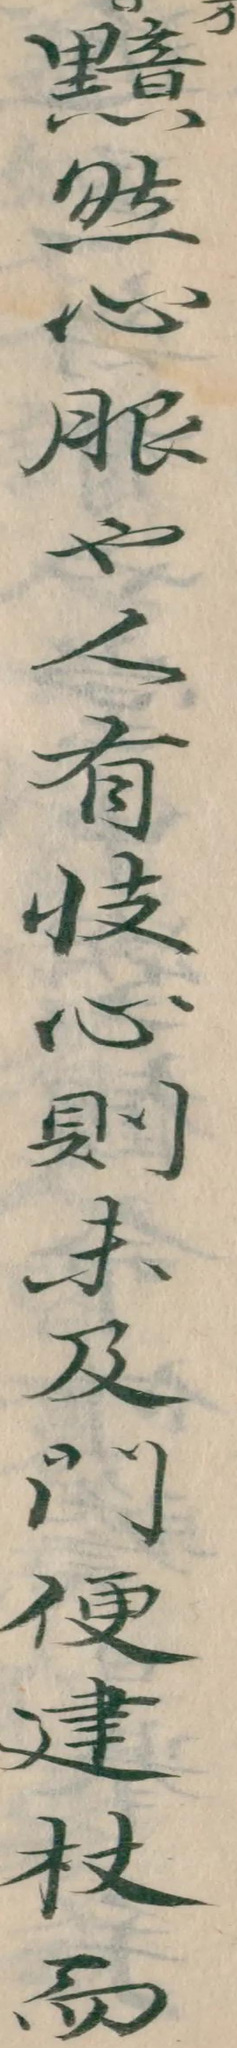不黯然心眼也人有忮心則末及門便建杖而
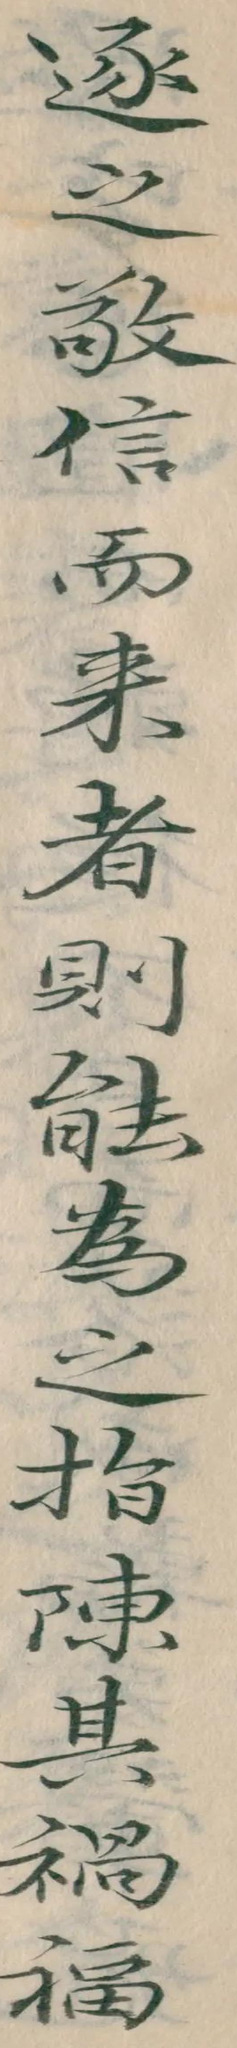逐之敬信而来者則能為之指陳其禍福
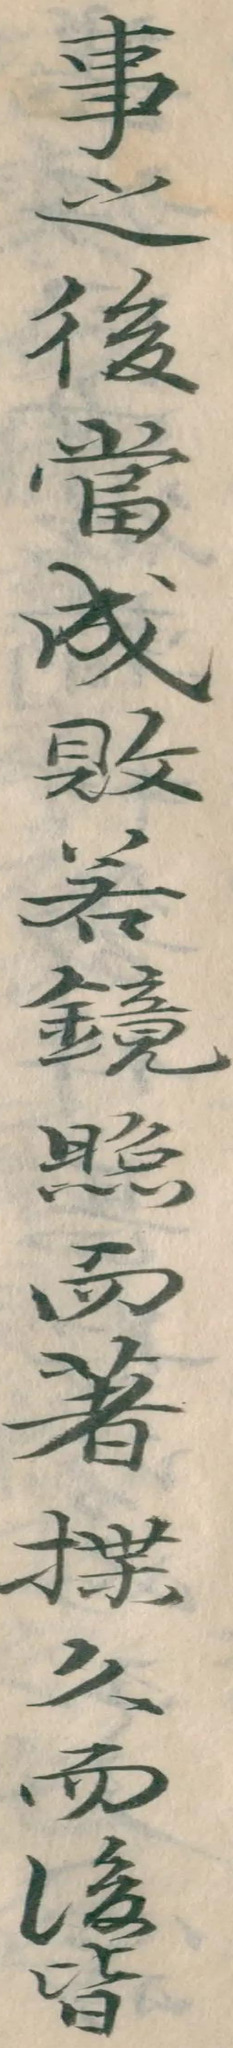事之後当成敗若鏡照而著揲久而後皆
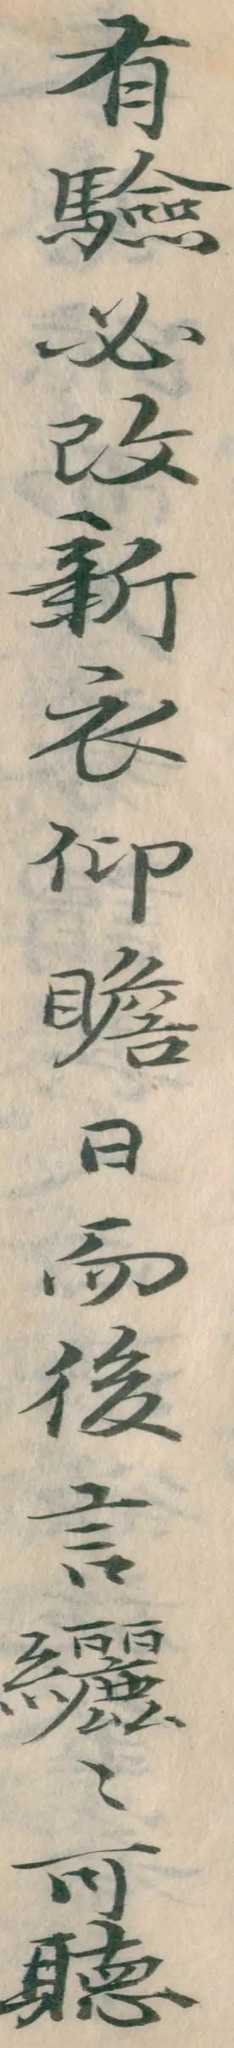有験必改新衣仰胆日而後言纚々可聴
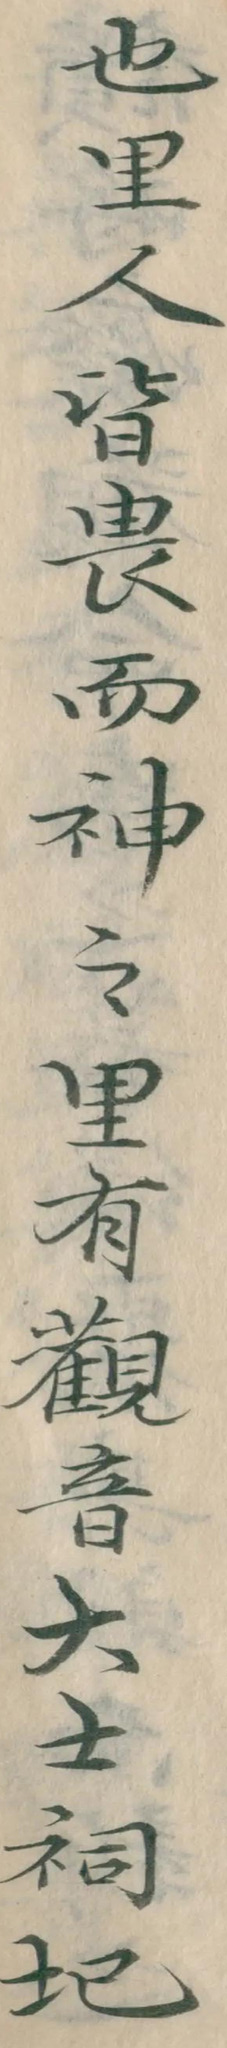也里人皆畏而神之里有観音大士祠圮

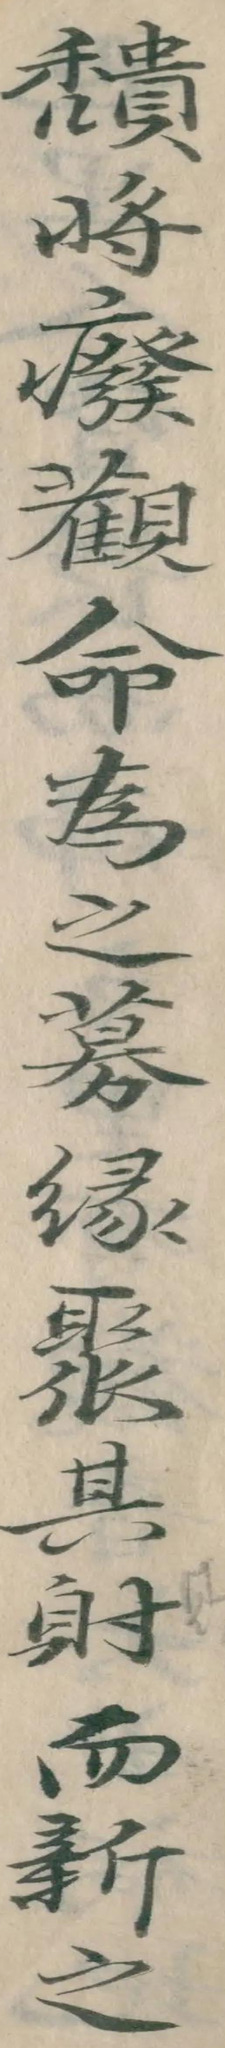穨将観命為之募縁聚其射而新之
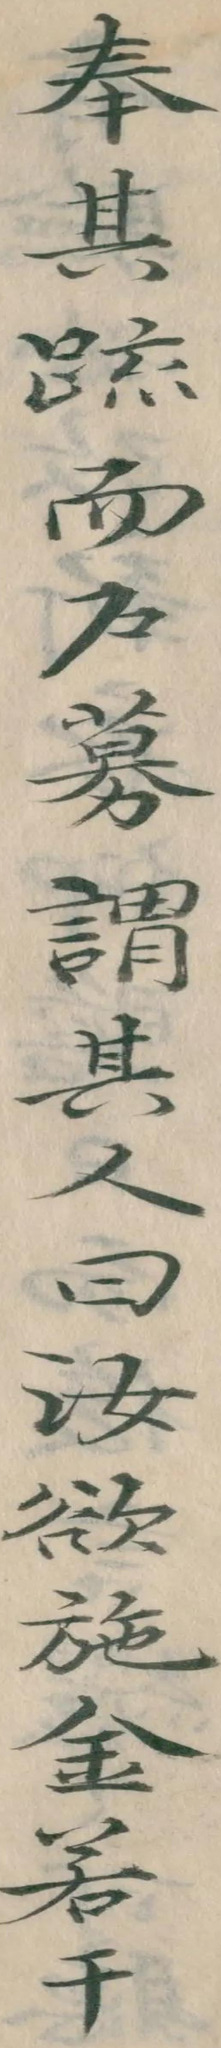奉其䟽而募謂其人曰汝施金若干
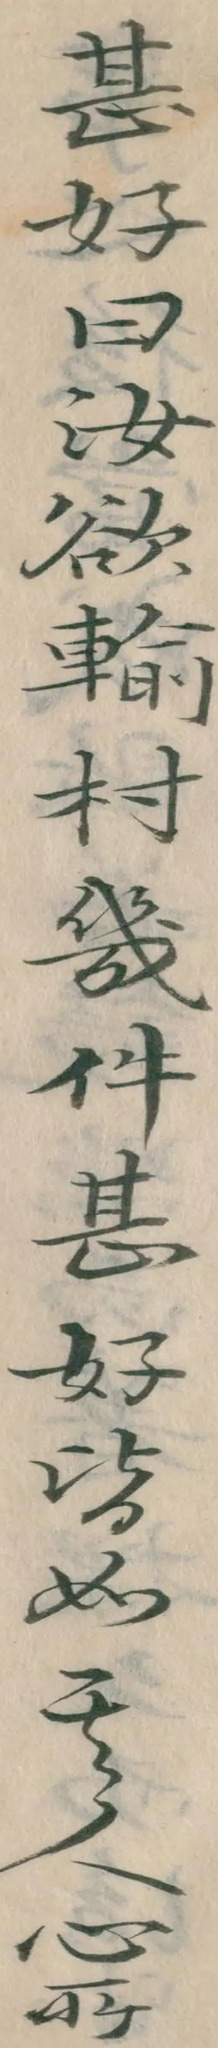甚好曰汝欲輸村幾件甚好皆如其人心所
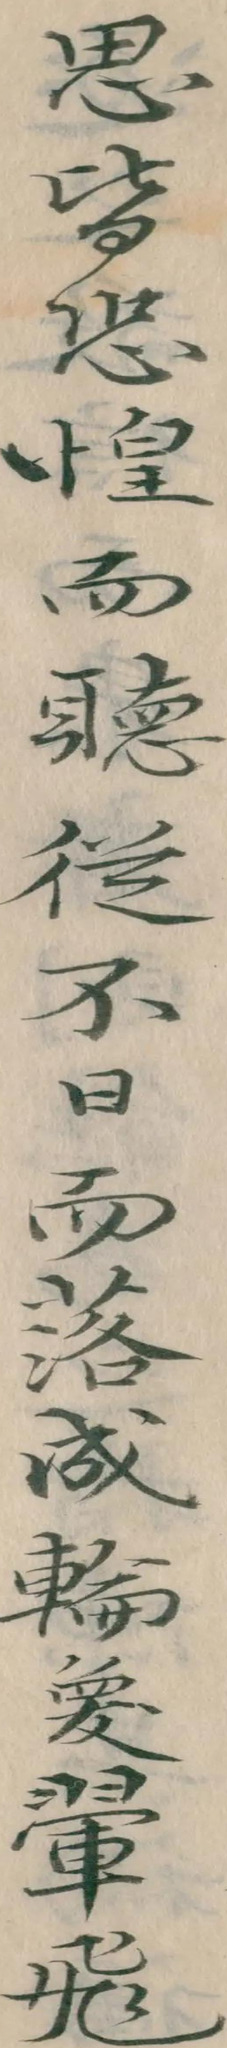思皆恐惶而聴従不日而落成輪翬飛
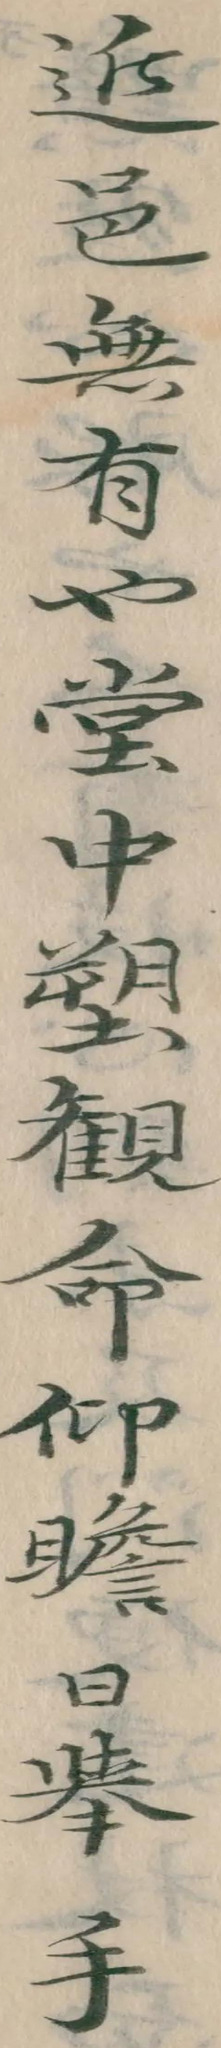近邑無有也堂中塑観命仰胆日挙手
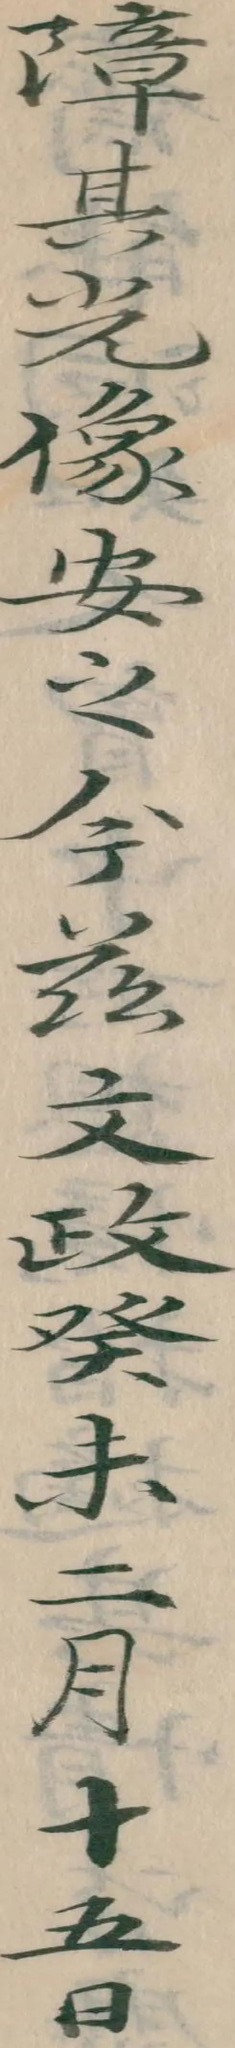障其光像安之今茲文政癸未二月十五日
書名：輪池叢書. 12
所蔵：国立国会図書館 National Diet Library, JAPAN
